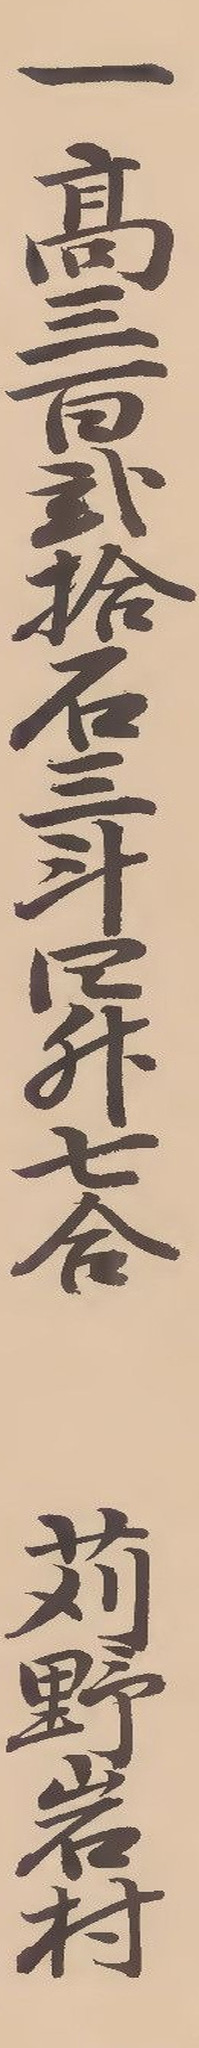一高三百弐拾石三斗四升七合苅野岩村
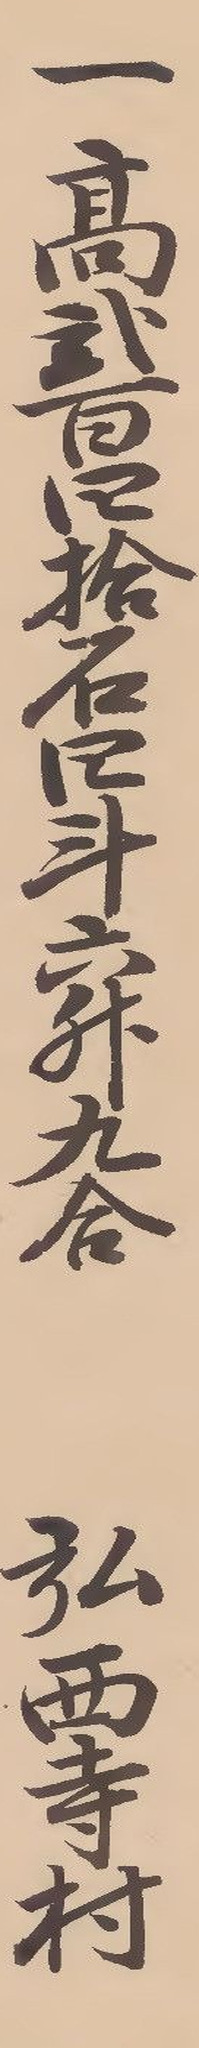一高弐百四拾石四斗六升九合弘西寺村
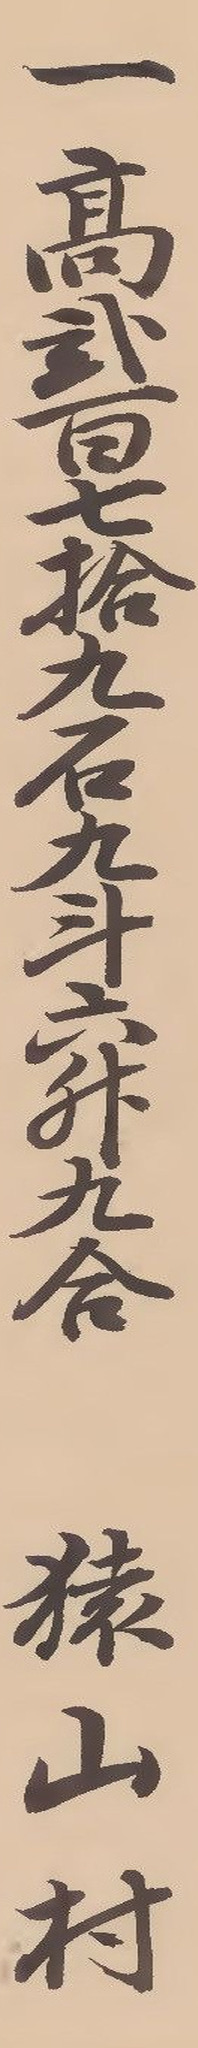一高弐百七拾九石九斗六升九合猿山村
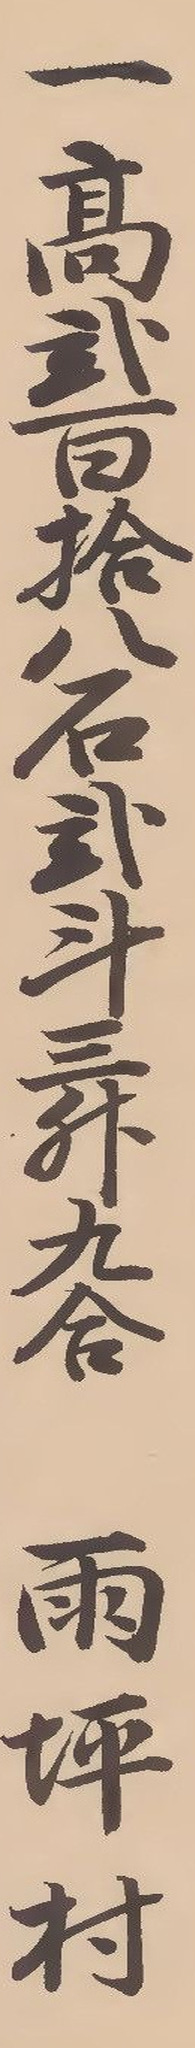一高弐百拾八石弐斗三升九合雨坪村
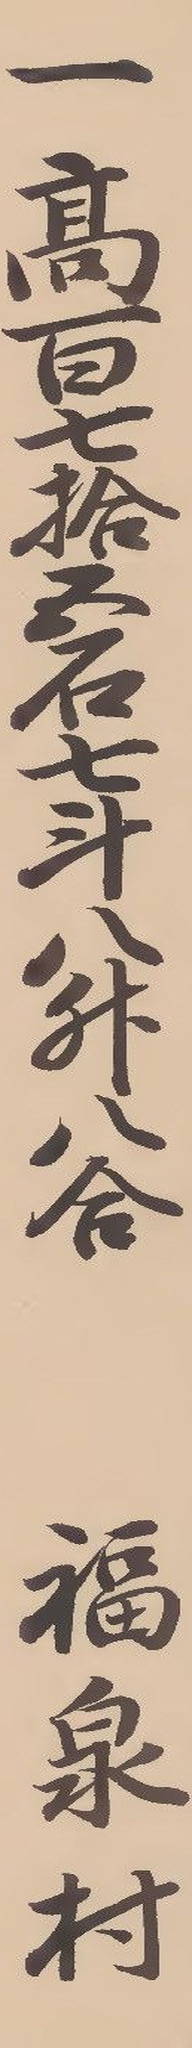一高百七拾五石七斗八升八合福泉村
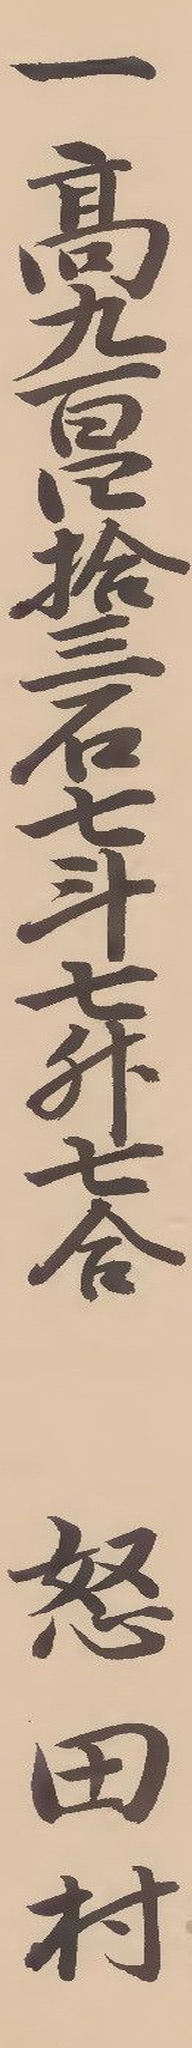一高九百四拾三石七斗七升七合怒田村
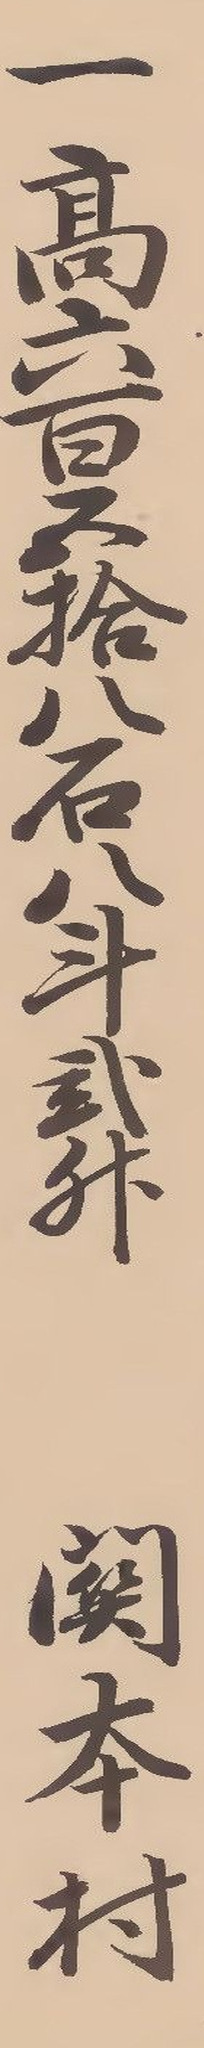一高六百五拾八石八斗弐升関本村
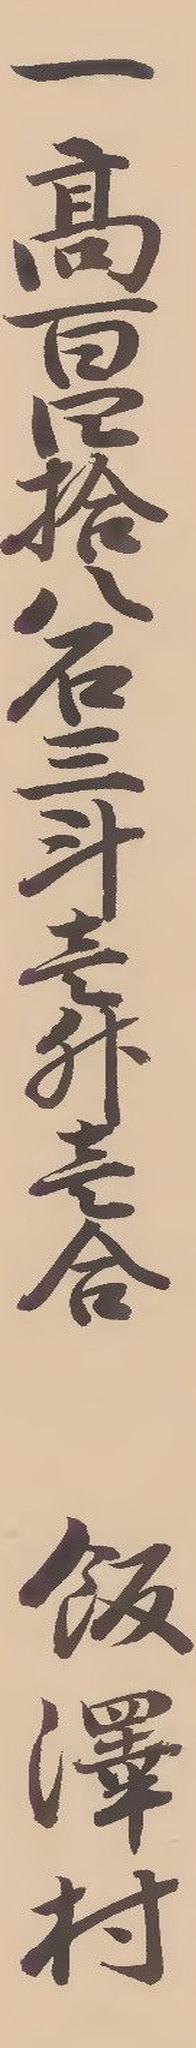一高百四拾八石三斗壱升壱合飯澤村

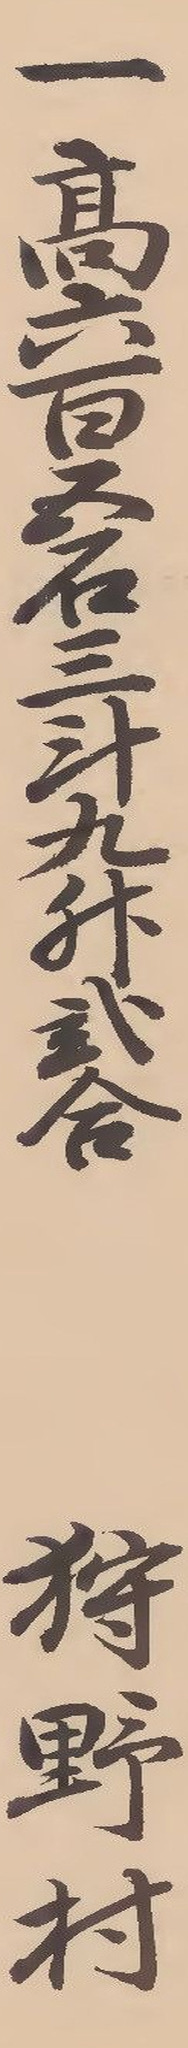一高六百五石三斗九升弐合狩野村
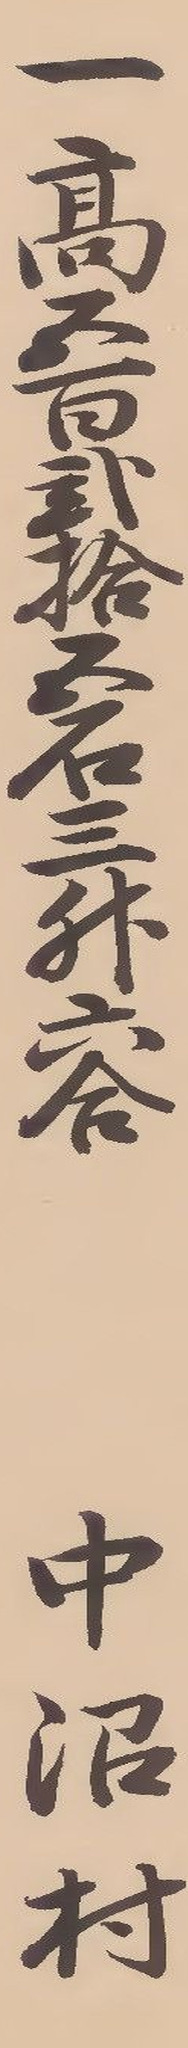一高五百弐拾五石三升六合中沼村
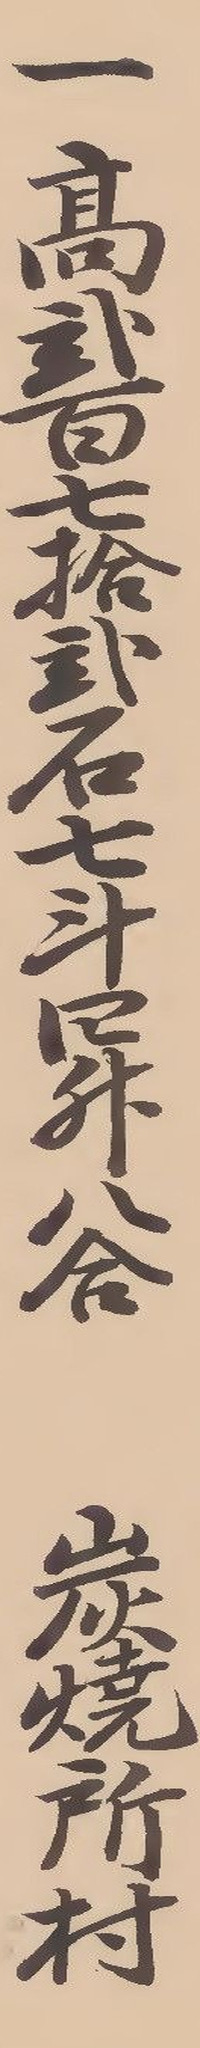一高弐百七拾弐石七斗四升八合炭焼所村
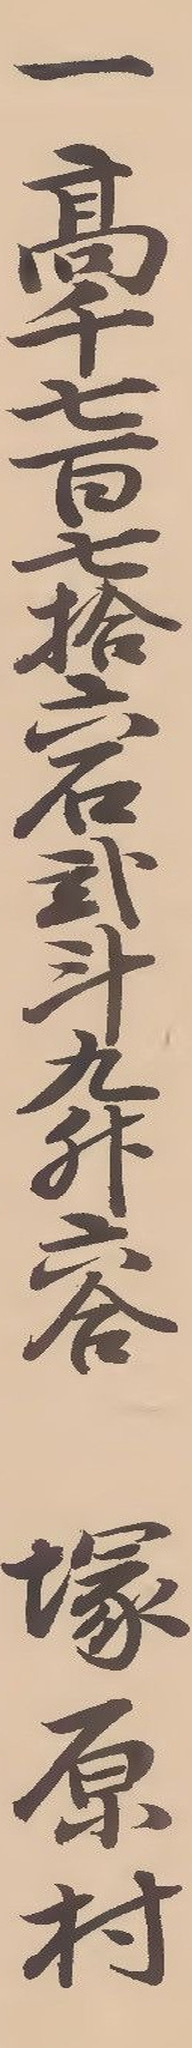一高千七百七拾六石弐斗九升六合塚原村
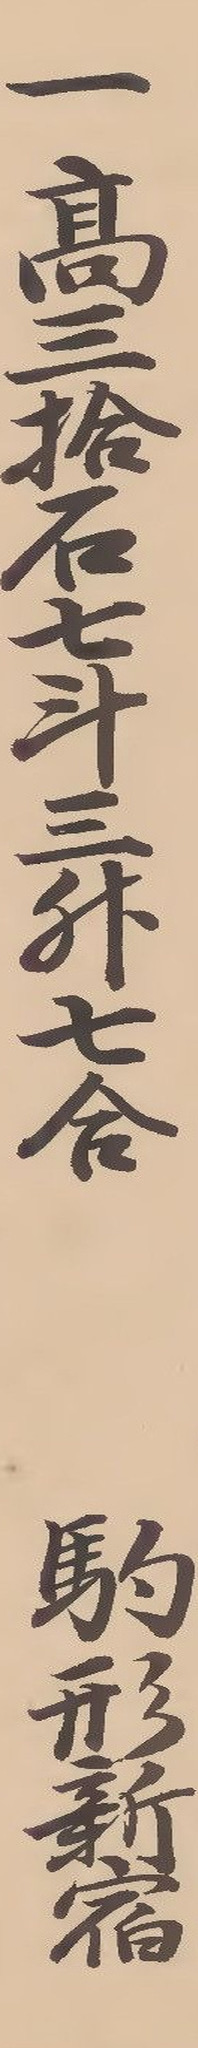一高三拾石七斗三升七合駒形新宿
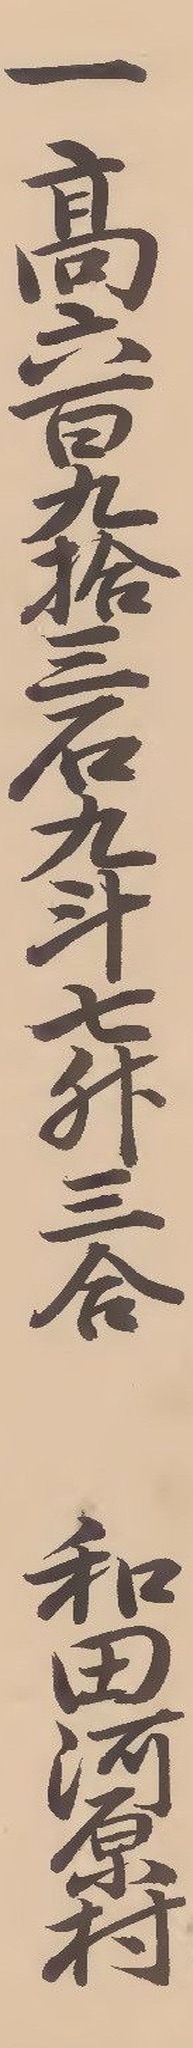一高六百九拾三石九斗七升三合和田河原村
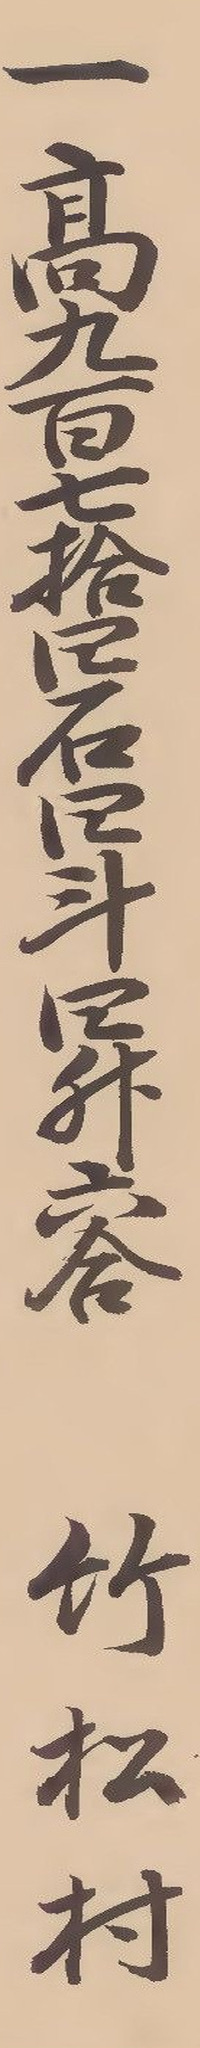一高九百七拾四石四斗四升六合竹松村
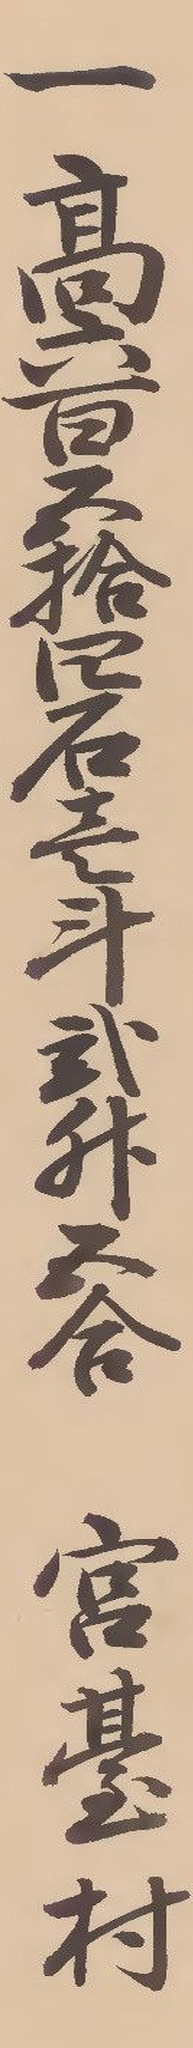一高六百五拾四石壱斗弐升五合宮台村
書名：相模国郷帳
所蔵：国立公文書館 National Archives of Japan
